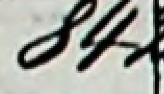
84
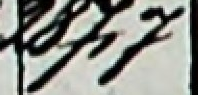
287,7
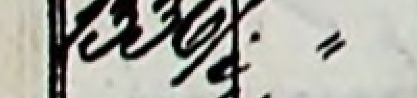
1336/c „
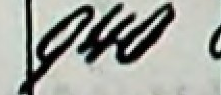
940
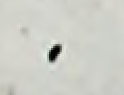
,
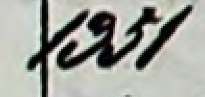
1351
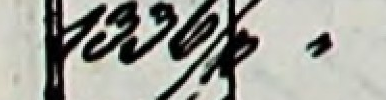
1336/k „
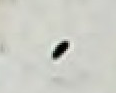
,
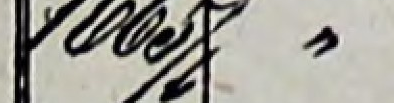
1665/b „
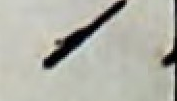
1
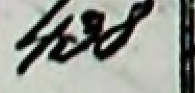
438
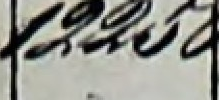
1225
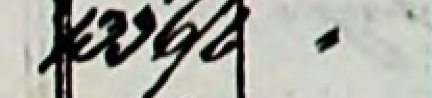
1336/l „
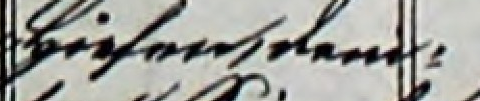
Hirfenm dem„
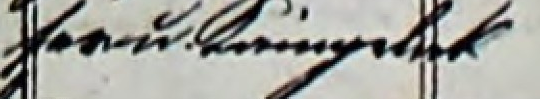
ser u. Kaingelak
